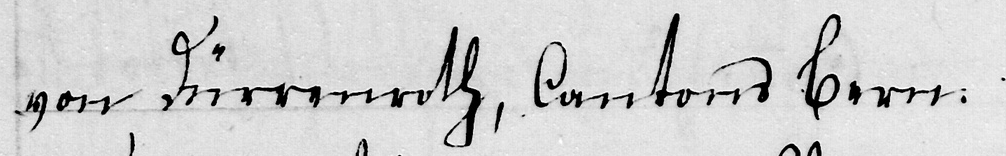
von Dürrenroth, Cantons Bern.
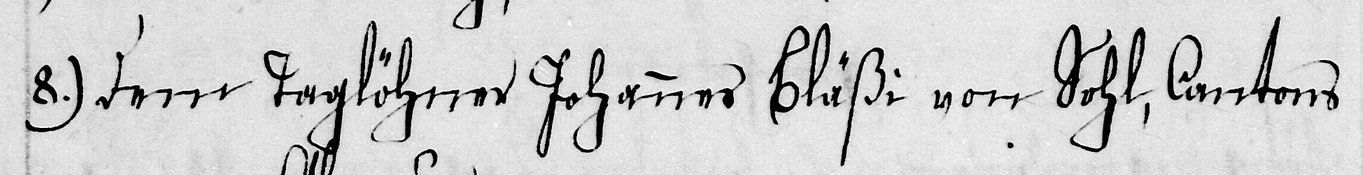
8.) Dem Taglöhner Johannes Bläßi von Sohl, Cantons
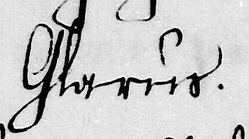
Glarus.
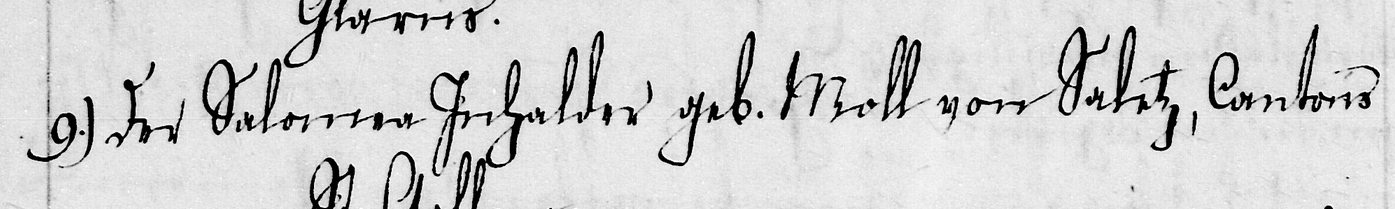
9.) Der Salomea Inhalder geb. Moll von Saletz, Cantons
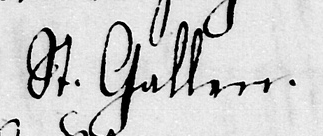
St. Gallen.
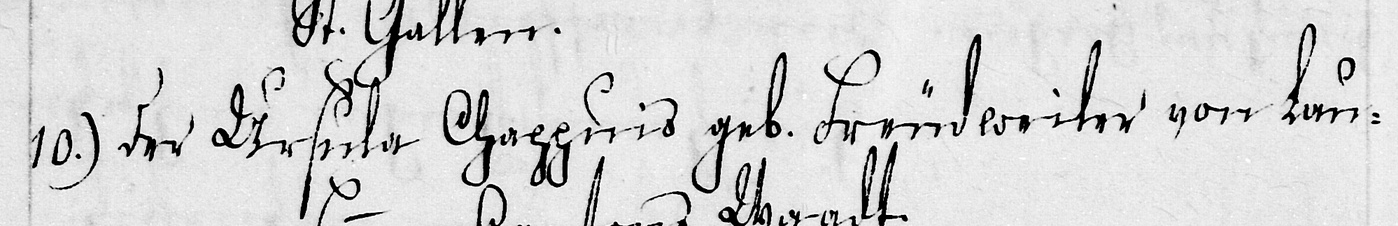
10.) Der Ursula Chappuis, geb. Freudweiler von Lau¬
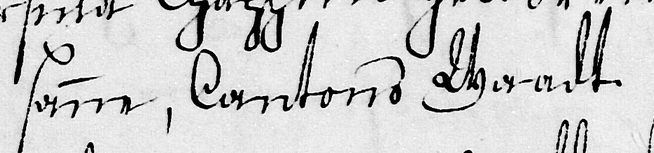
sanne, Cantons Waadt.
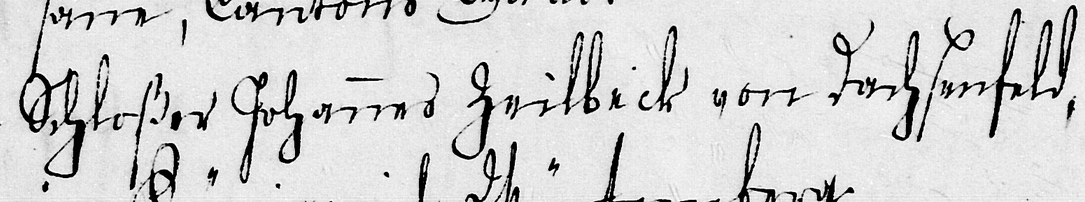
Schloßer Johannes Zeilbeck von Dachsenfeld,
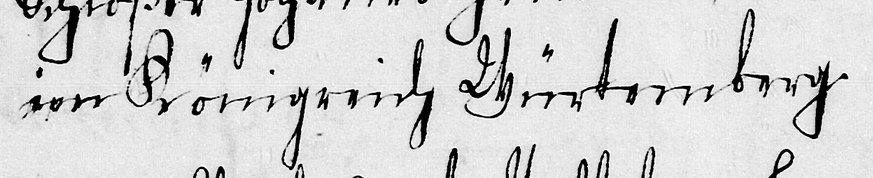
im Königreich Würtemberg.
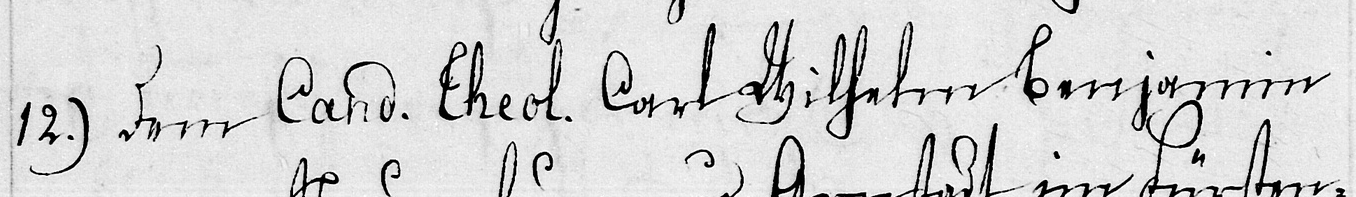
12.) Dem Cand. Theol. Carl Wilhelm Benjamin
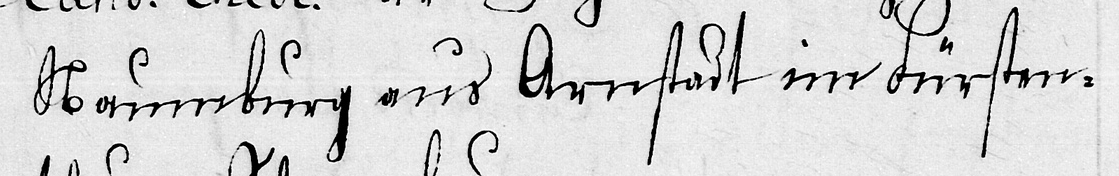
Naumburg aus Arnstadt im Fürsten¬
